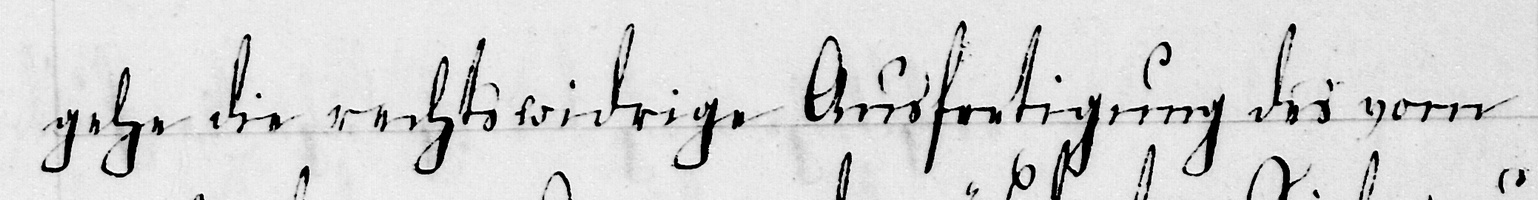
gehe die rechtswidrige Ausfertigung des vom
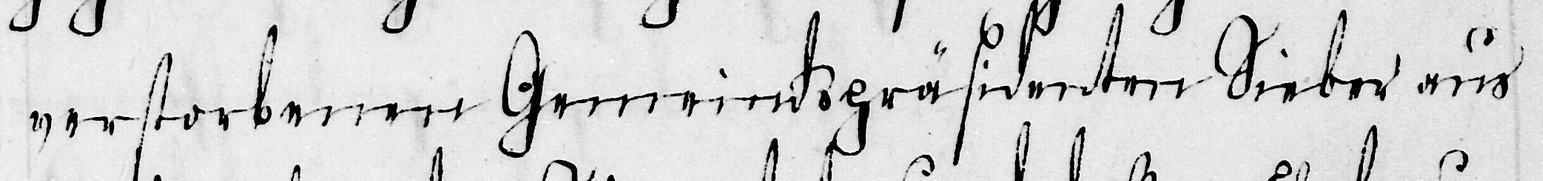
verstorbenen Gemeindspräsidenten Sieber aus
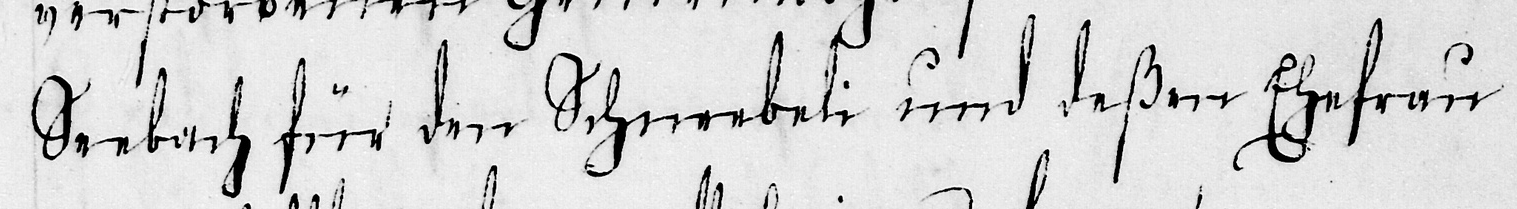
Seebach für den Schneebeli und deßen Ehefrau
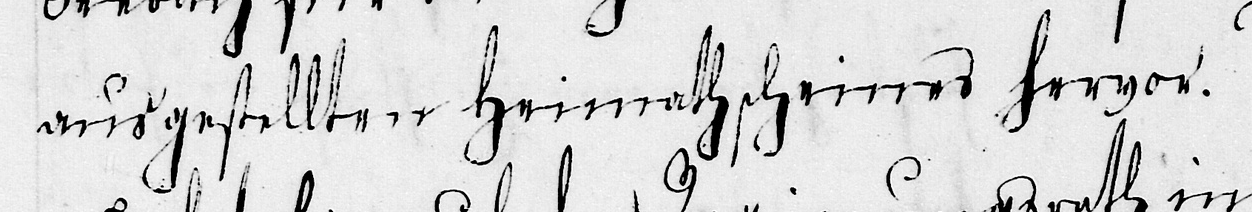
ausgestellten Heimathscheines hervor.
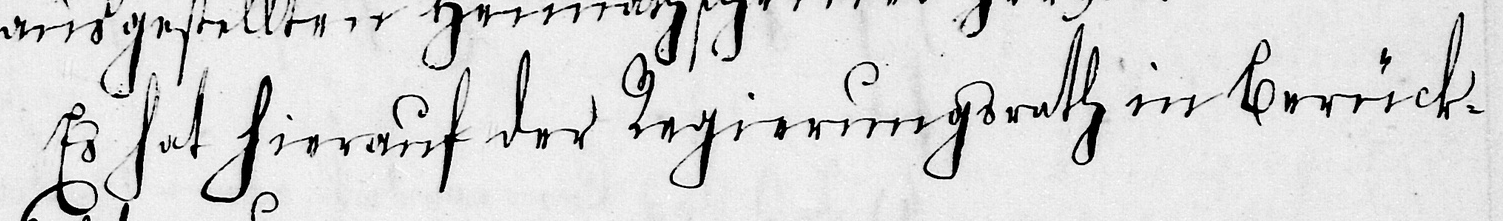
Es hat hierauf der Regierungsrath in Berück¬
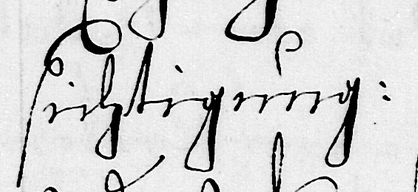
sichtigung:
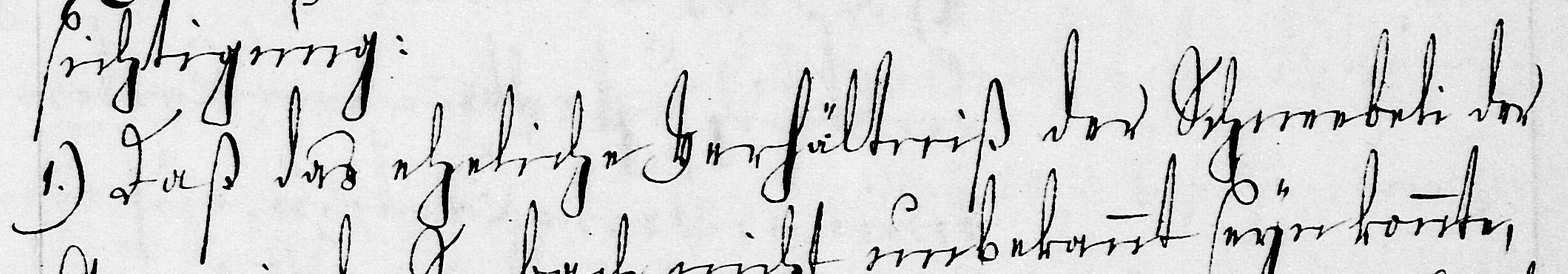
1.) Daß das eheliche Verhältniß der Schneebeli der
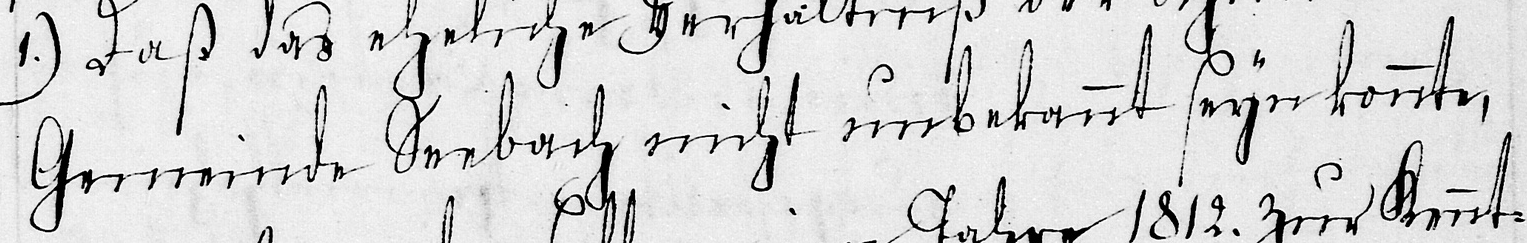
Gemeinde Seebach nicht unbekannt seyn konnte,
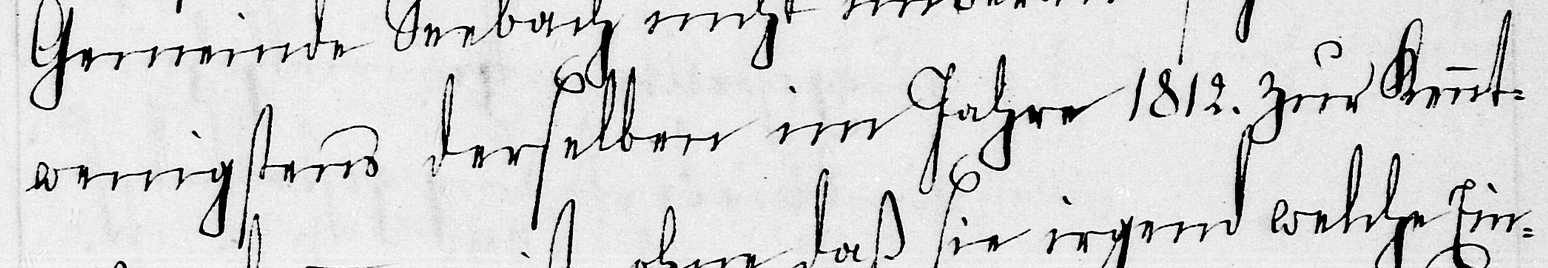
wenigstens derselben im Jahre 1812. zur Kennt¬
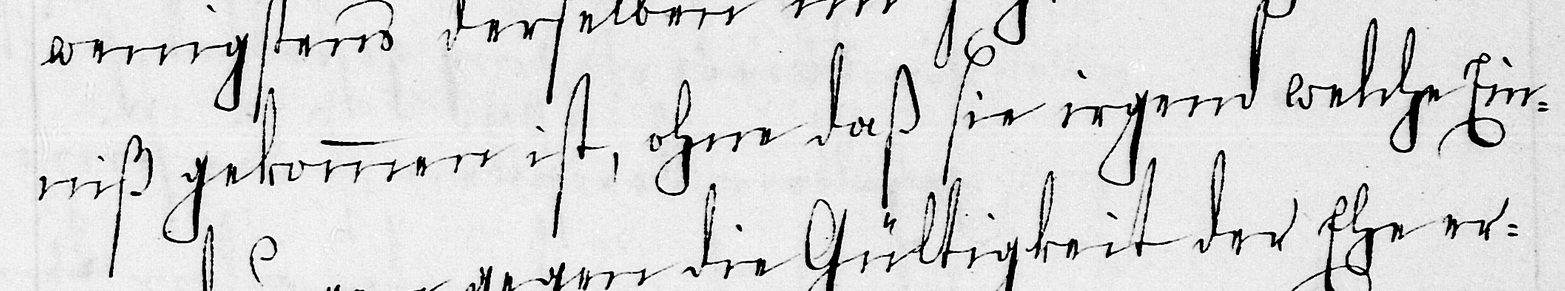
niß gekommen ist, ohne daß sie irgend welche Ein¬
